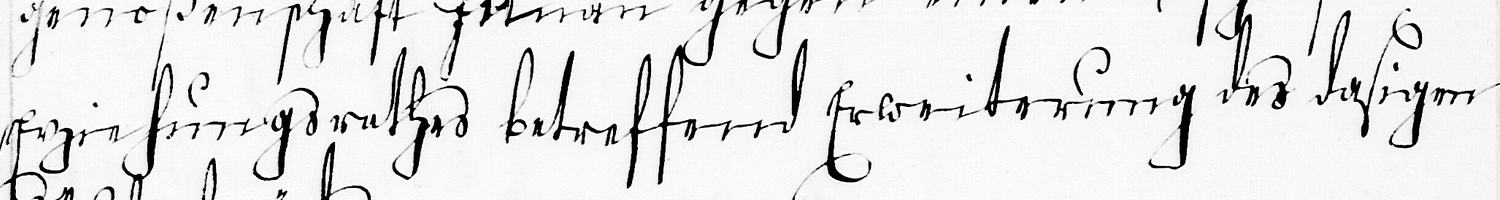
Erziehungsrathes betreffend Erweiterung des dasigen
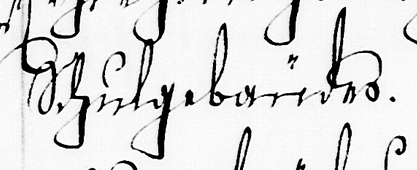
Schulgebäudes.
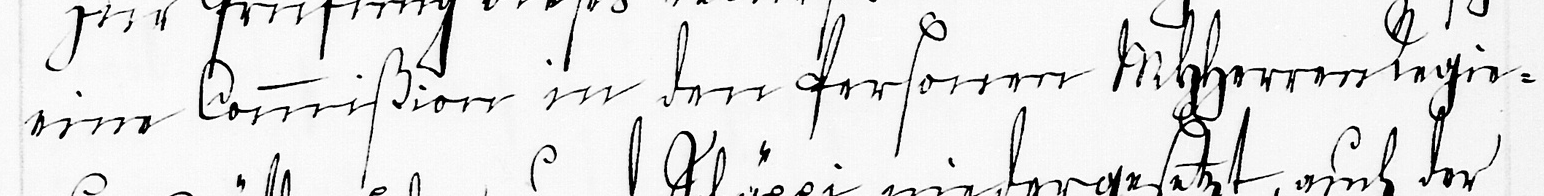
eine Commißion in den Personen MHHerren Regie¬
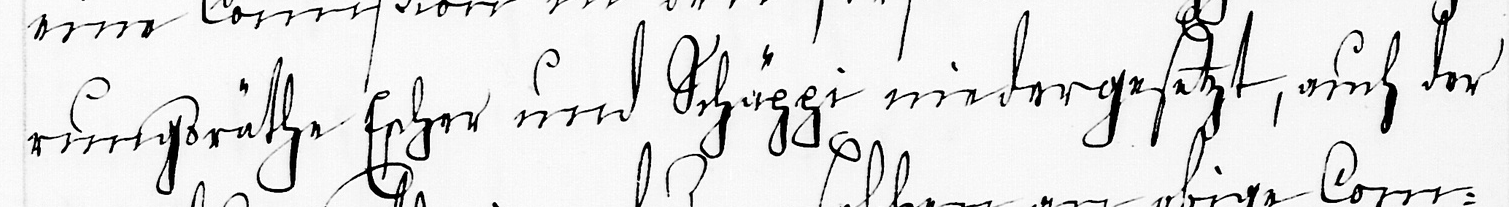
rungsräthe Escher und Schäppi niedergesetzt, auch der
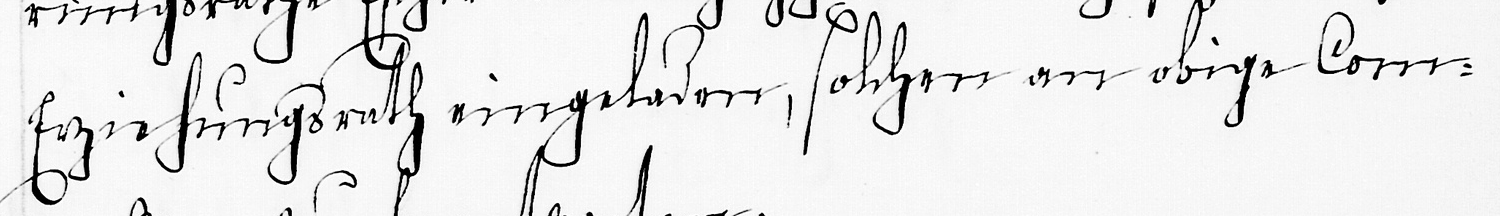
Erziehungsrath eingeladen, solchen an obige Com¬
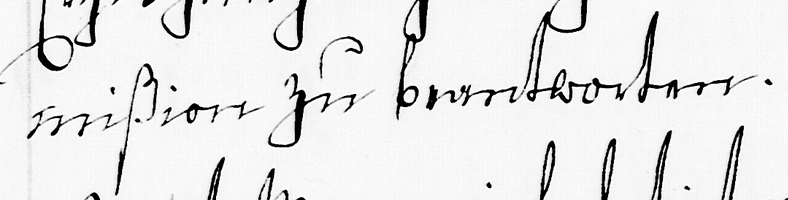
mißion zu beantworten.
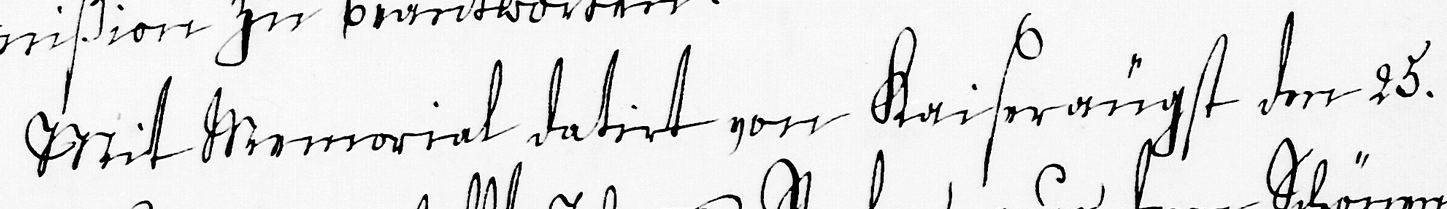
Mit Memorial datirt von Kaiseraugst den 25.
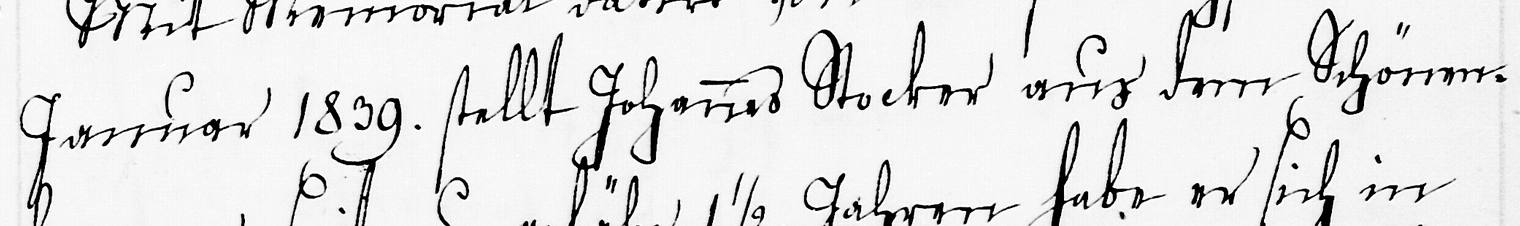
Januar 1839. stellt Johannes Stocker aus dem Schönen¬
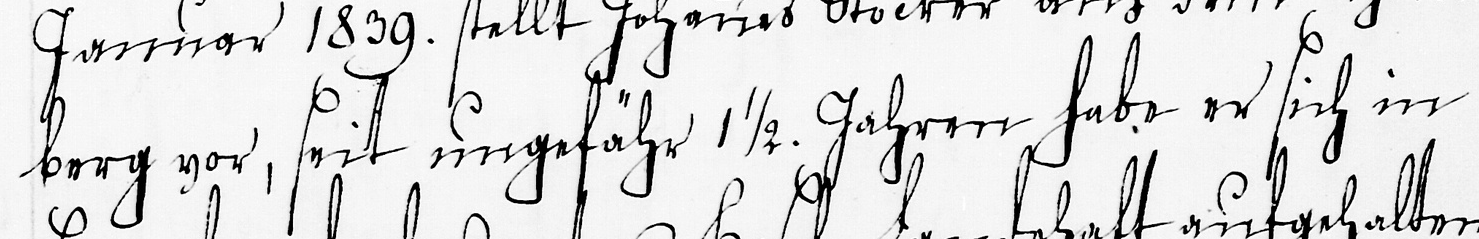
berg vor, seit ungefähr 1 ½. Jahren habe er sich in
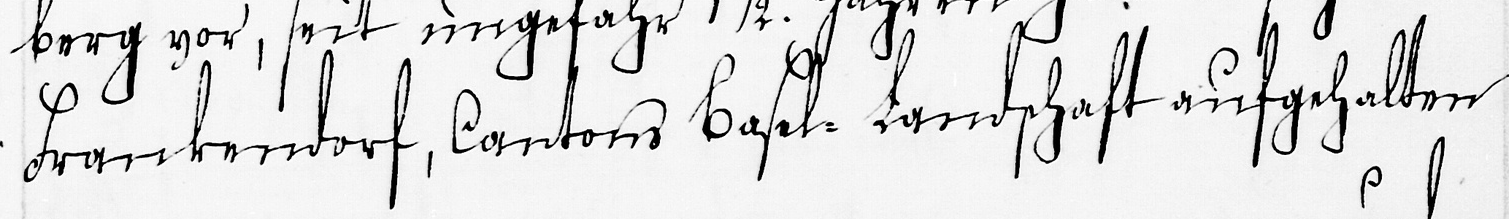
Frankendorf, Cantons Basel-Landschaft aufgehalten
